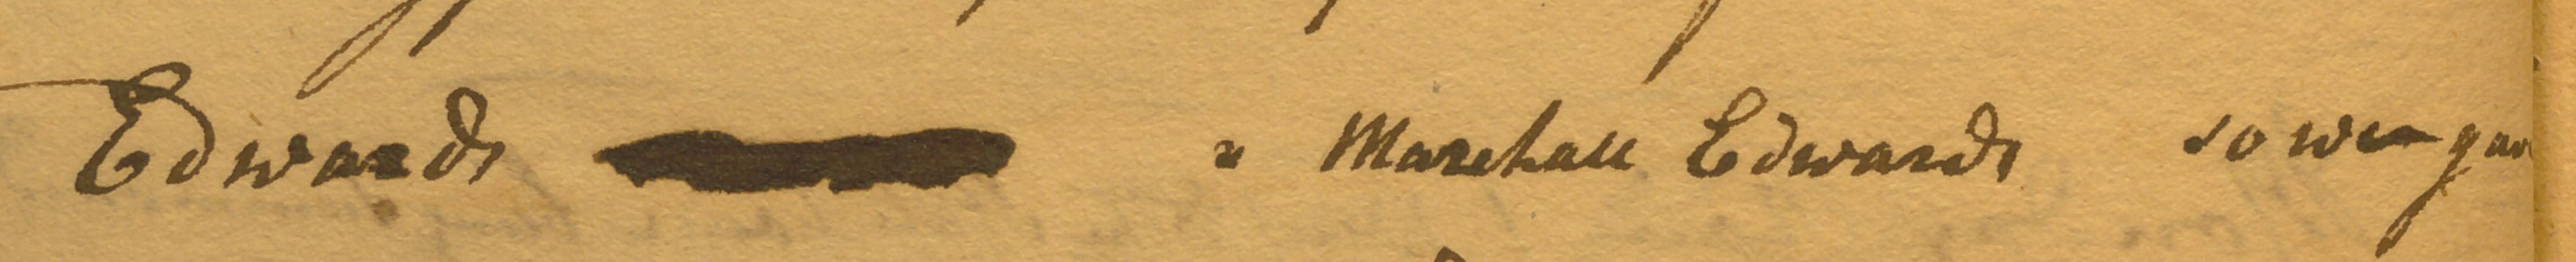Edwards [_____]. Marshall Edwards so we gave
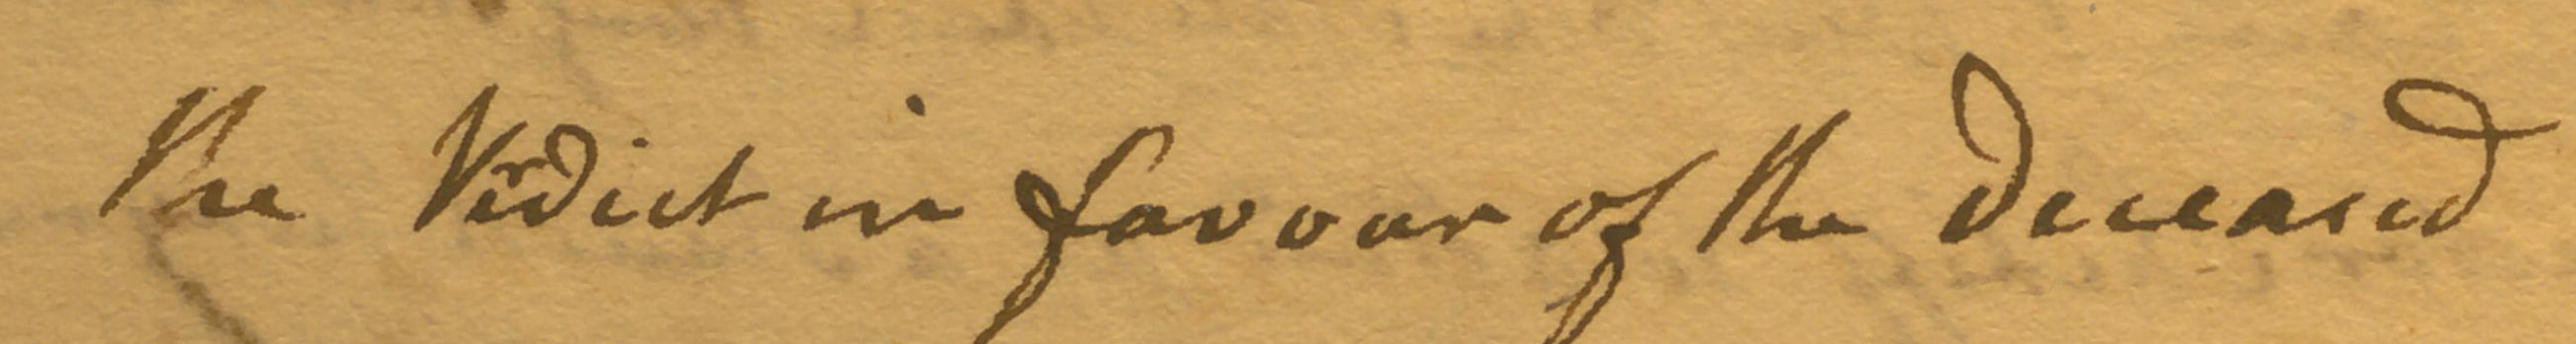the Ve^rdict in favour of the deceased
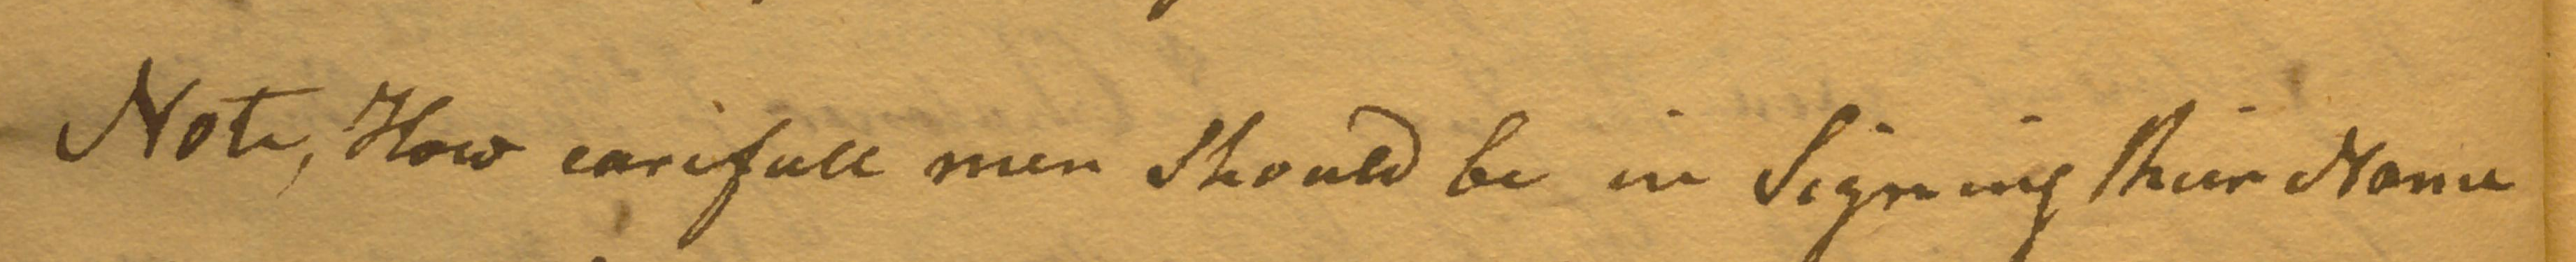Note, How carefull men should be in Signing their Name
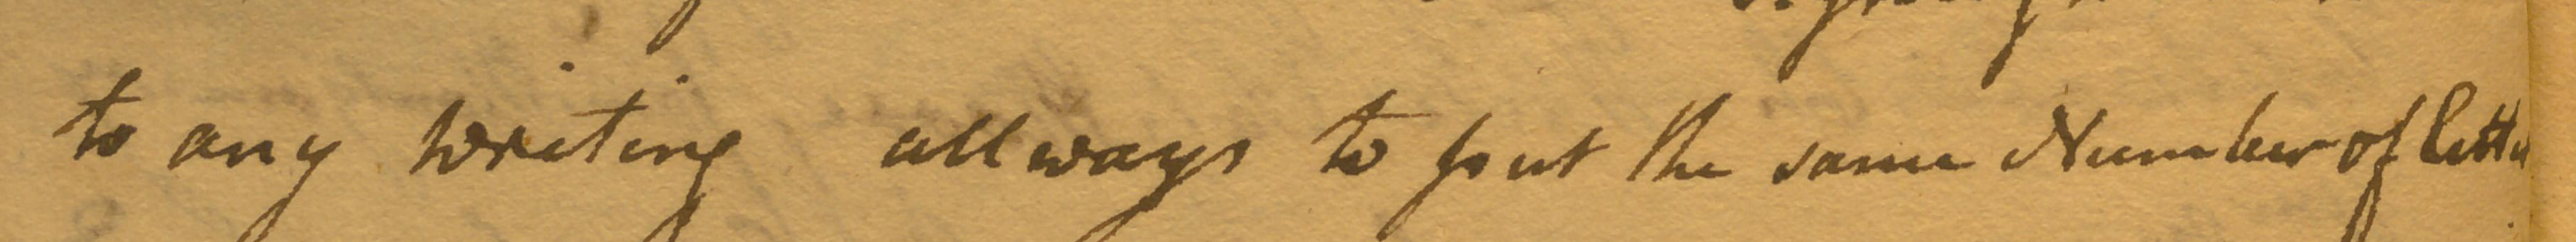to any writing allways to put the same Number of letter
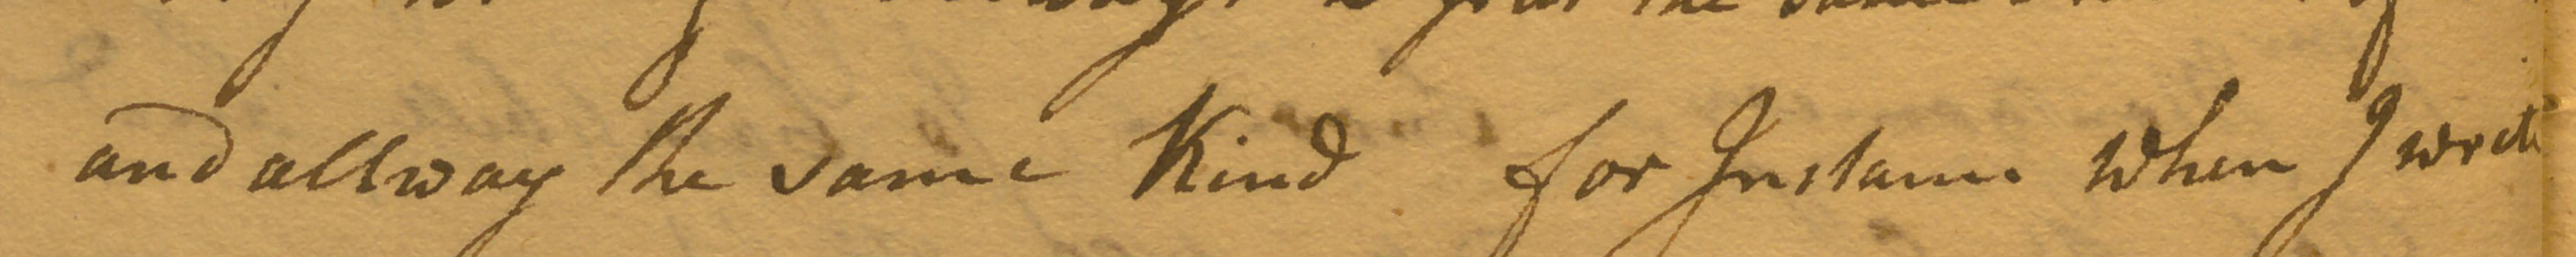and allway the same Kind for Instance when I wrote
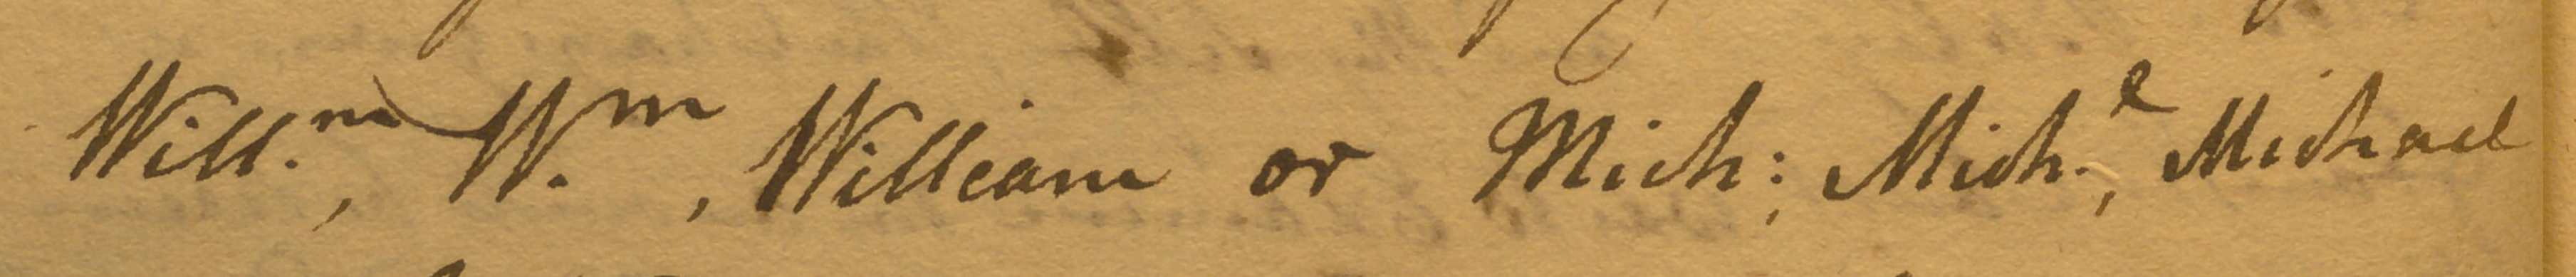Will^m., W^m., William or Mich: Mich^l. Michael
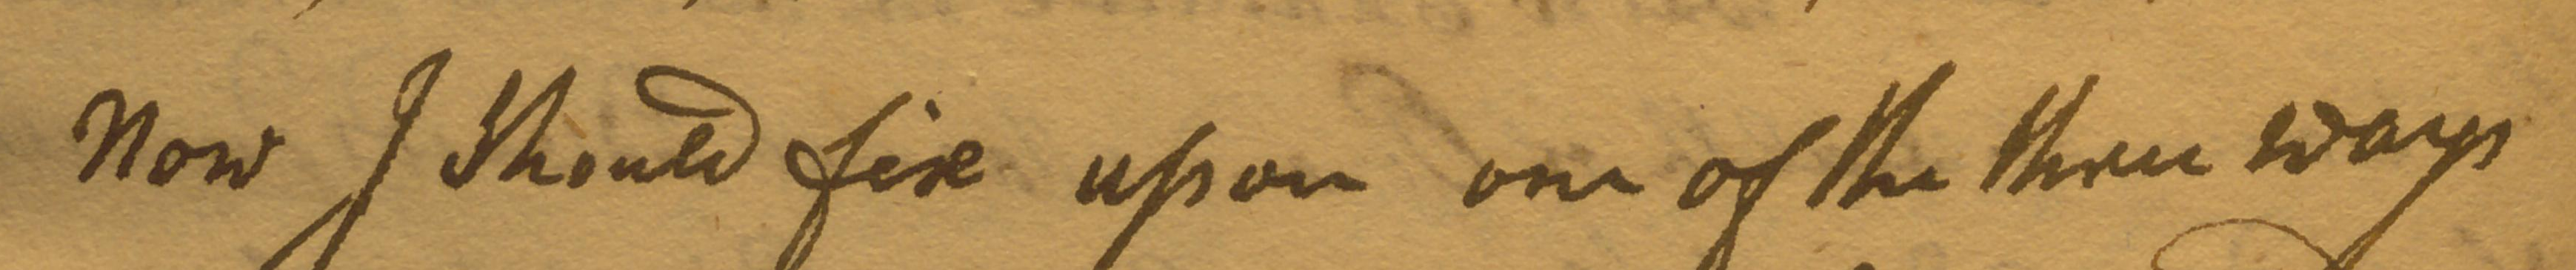Now I Should fix upon one of the three ways
